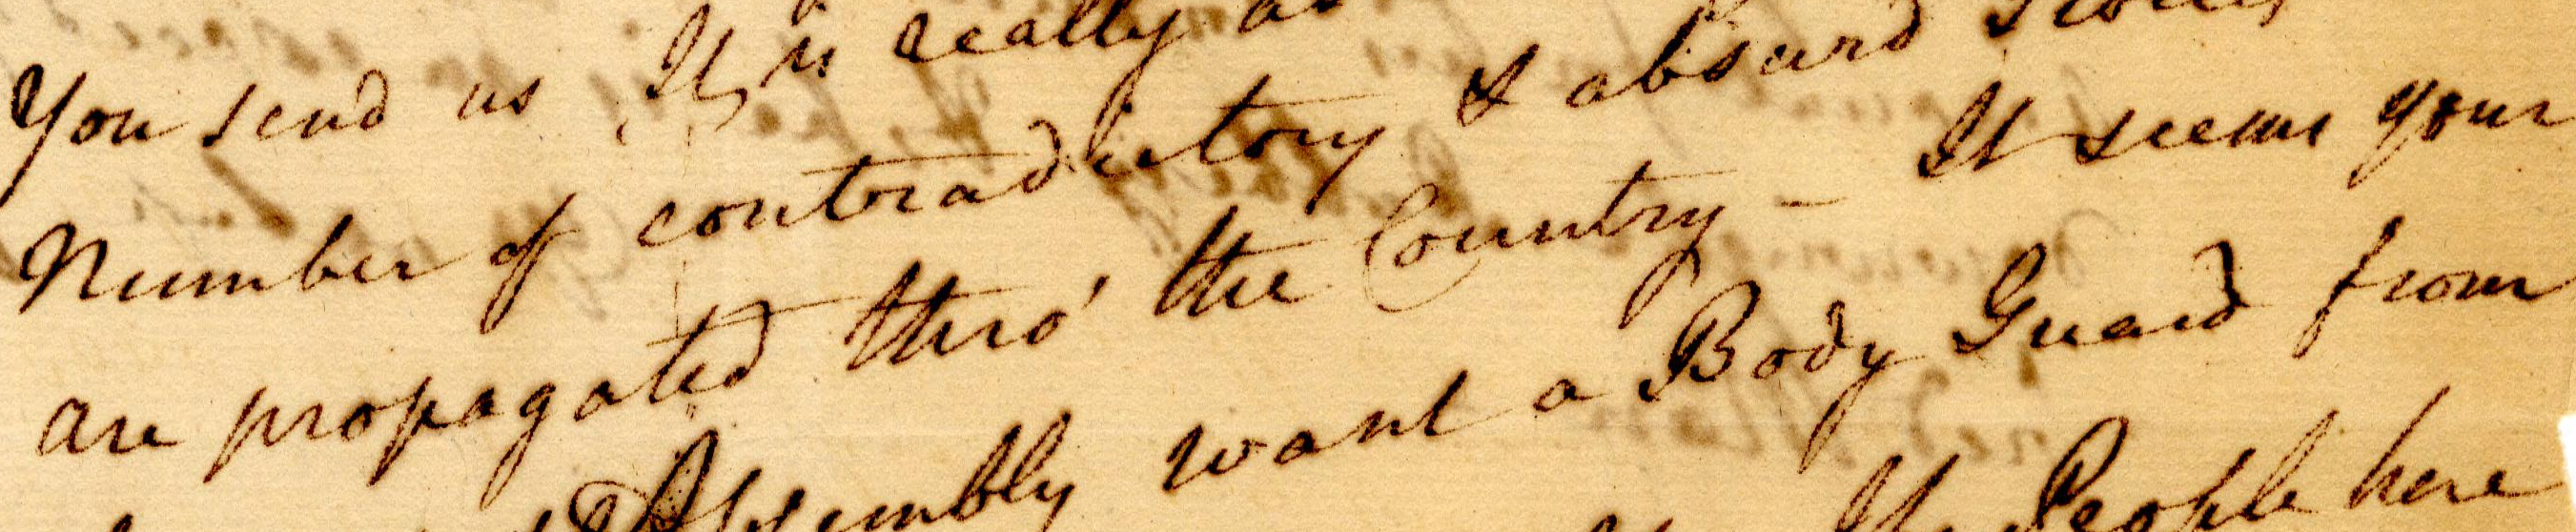are propagated thro' the Country- It seems your
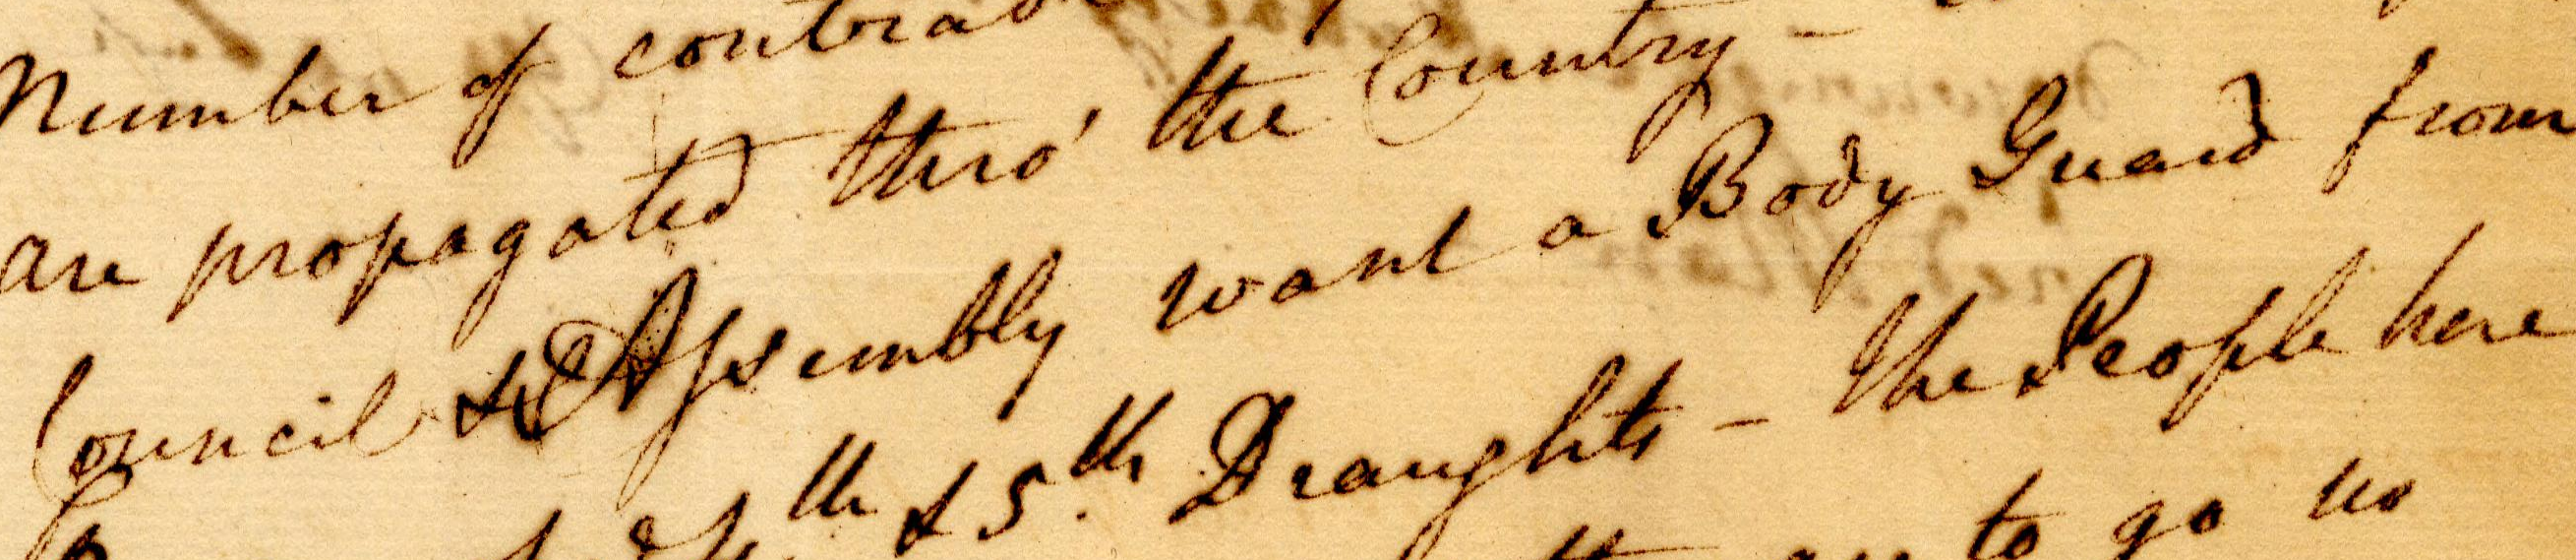Council & Assembly want a Body Guard from
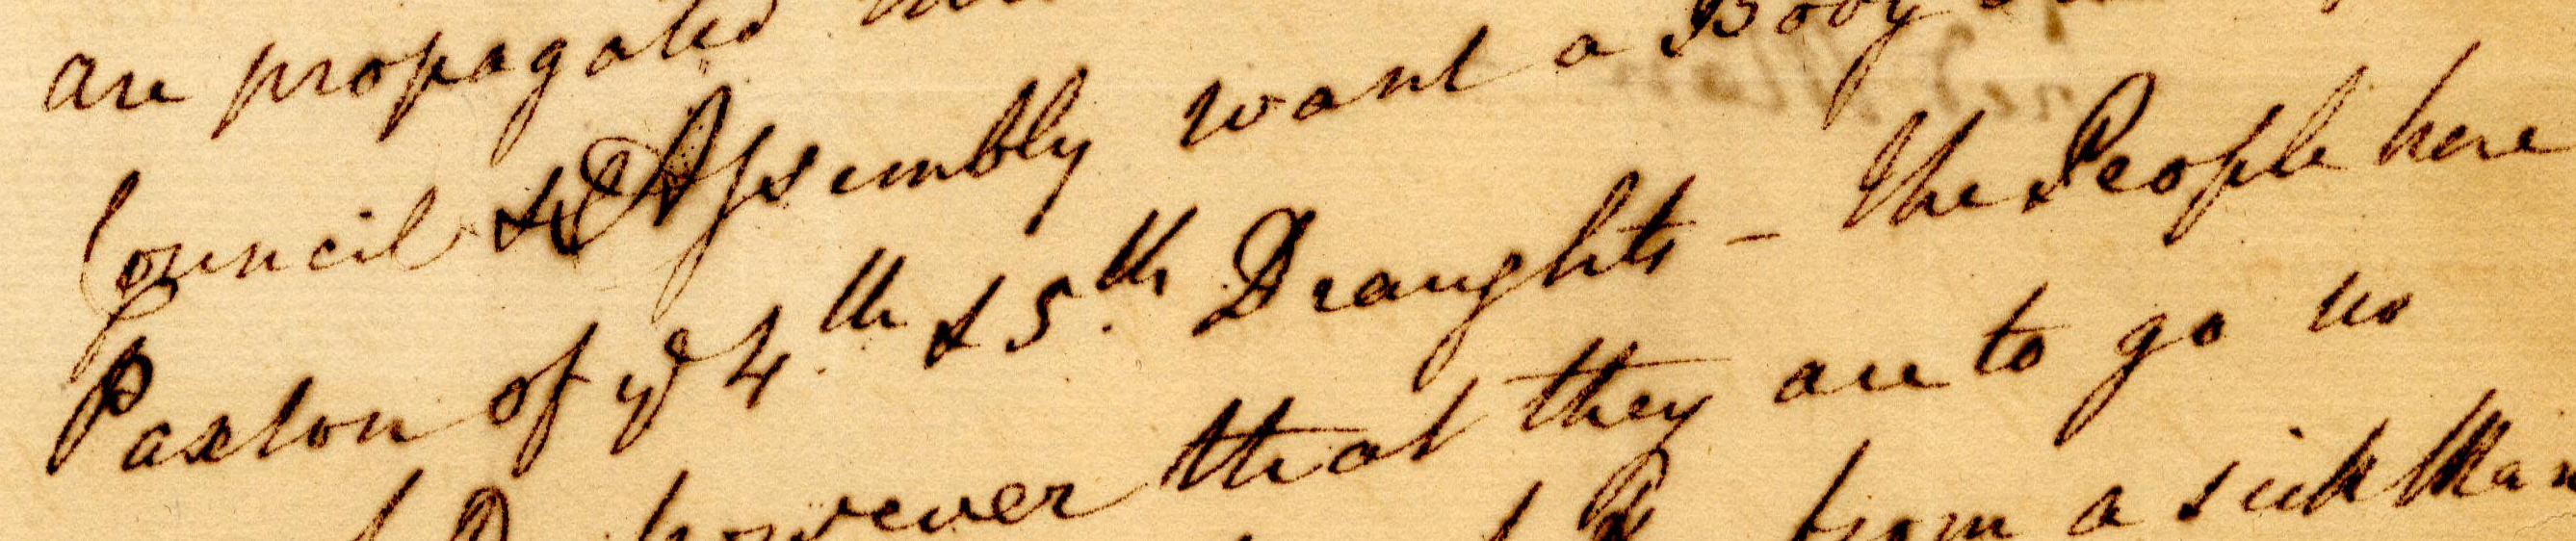Paxton of y^e 4^th. & 5^th. Draughts- The People here
